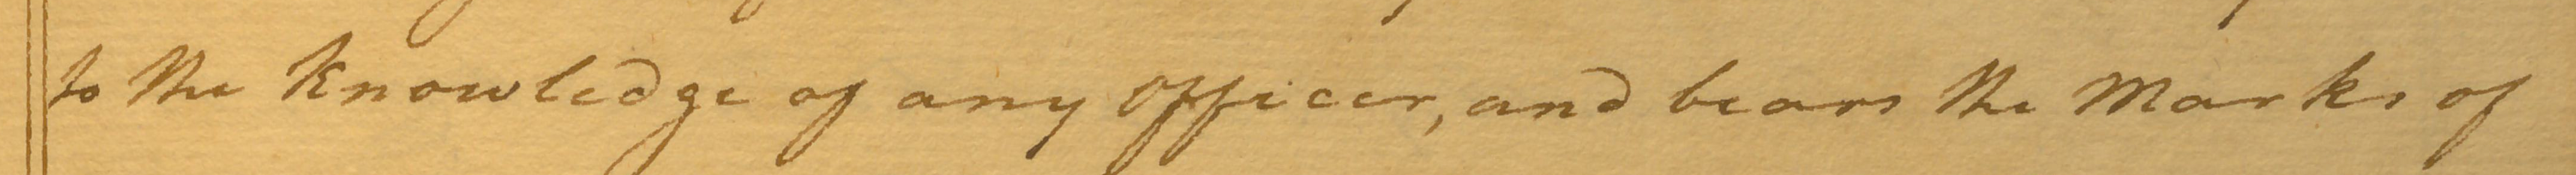to the knowledge of any Officer, and bear the marks of
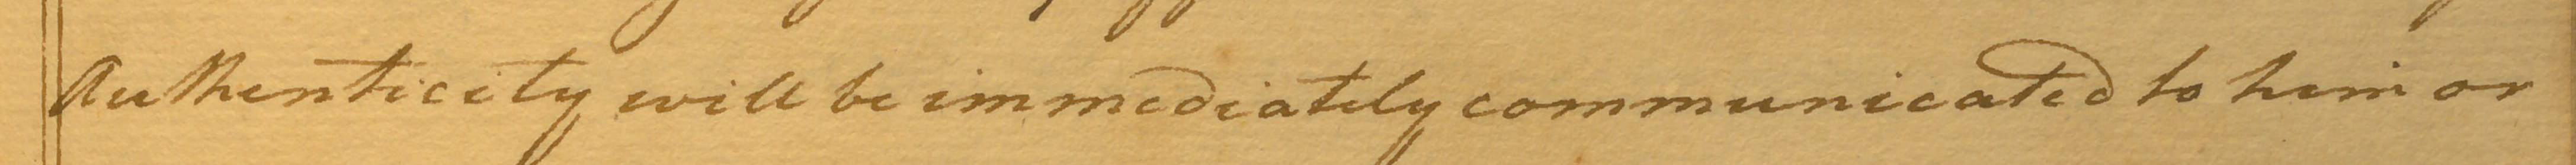Authenticity will be immediately communicated to him or
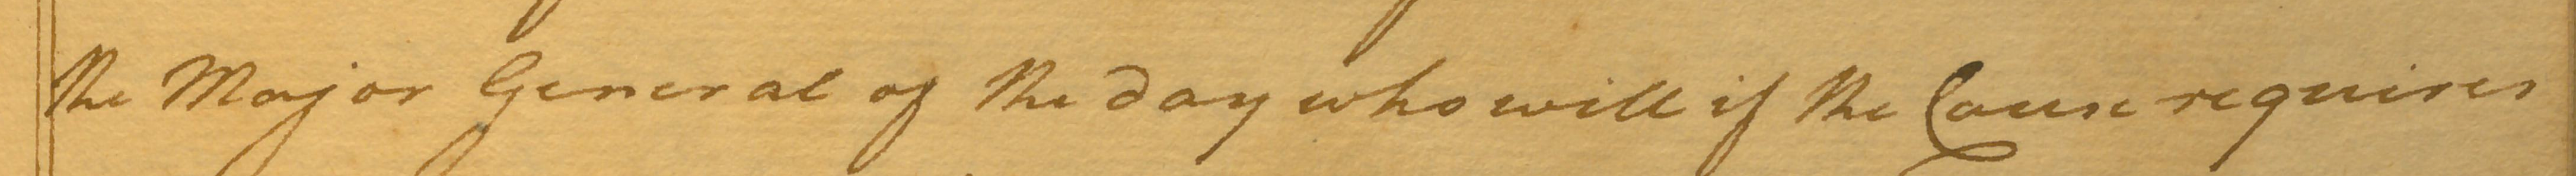the Major General of the day who will if the Cause requires
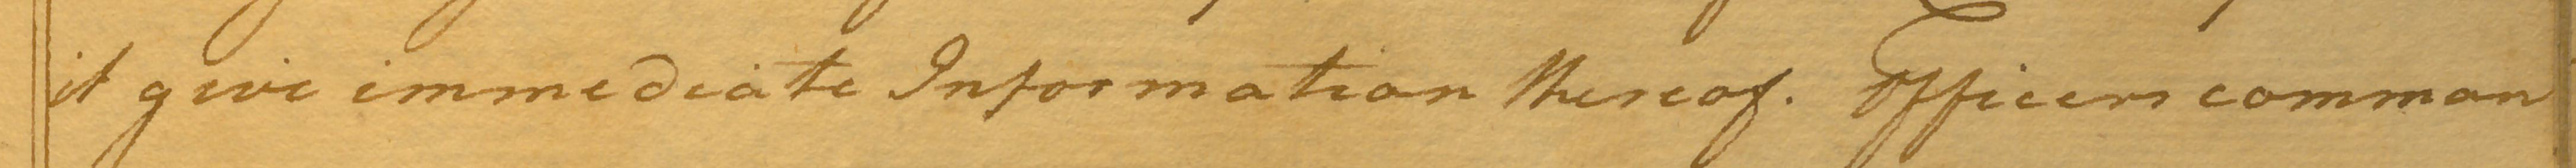it give immediate Information thereof. Officers comman
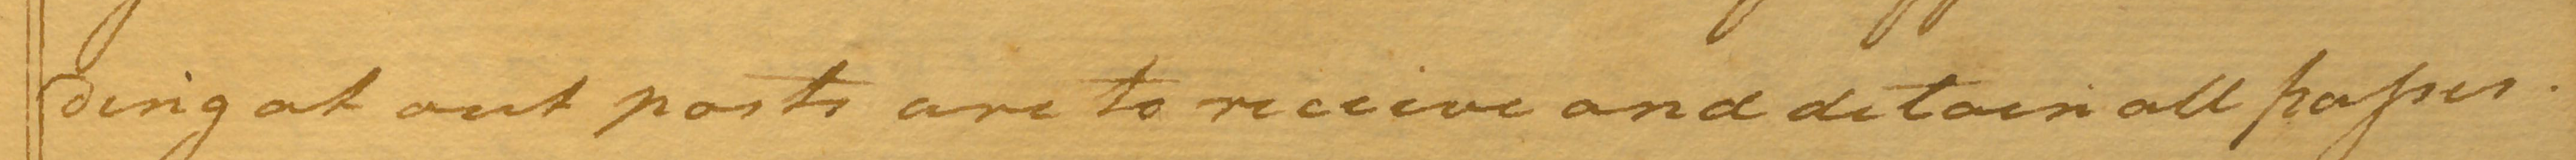ding at out posts are to receive and detain all papers
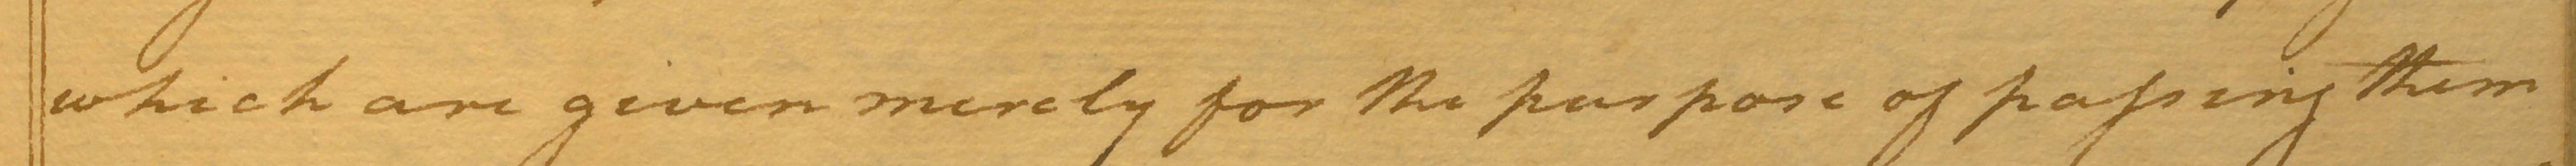which are given merely for the purpose of passing them
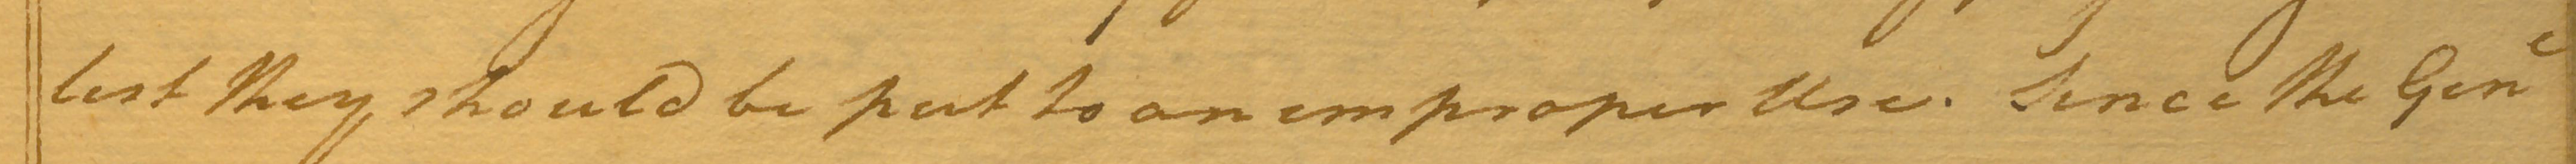lest they should be put to an improper Use. Since the Gen^l
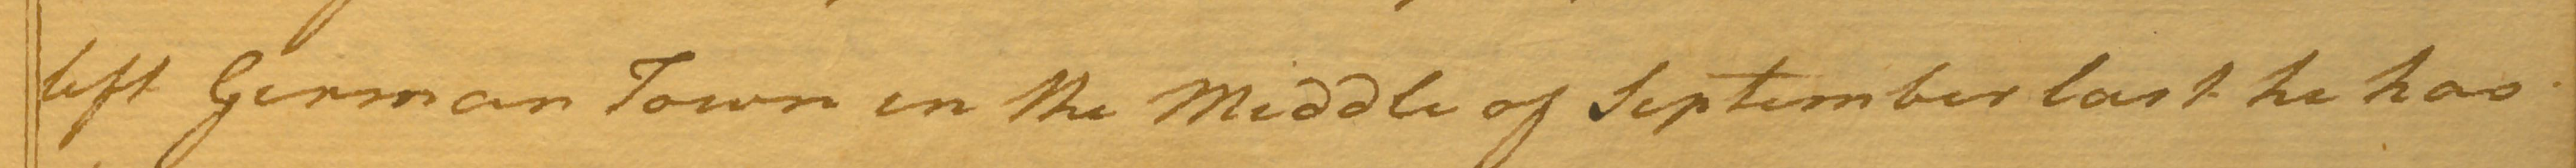left German Town in the Middle of September last he has
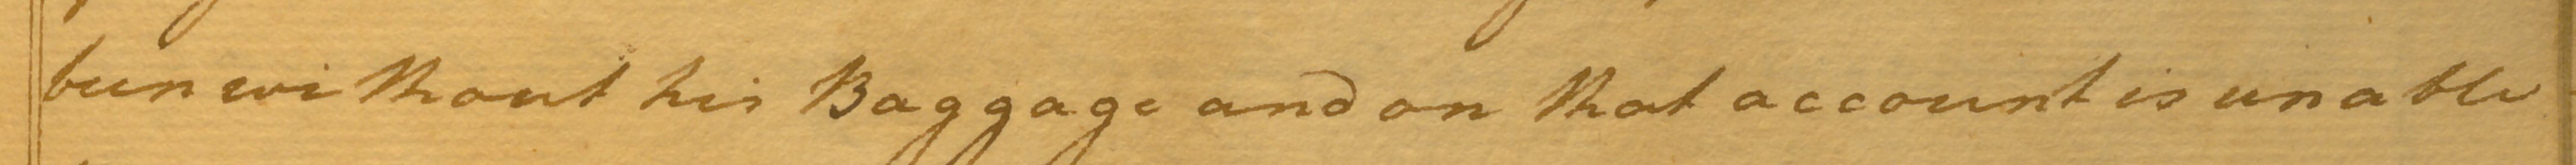been without his Baggage and on that account is unable
